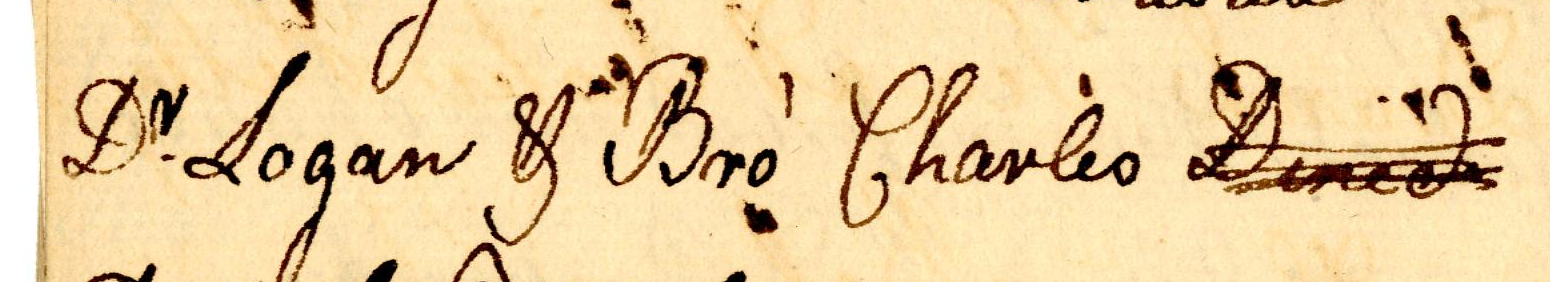D^r. Logan & Bro' Charles [Dined]
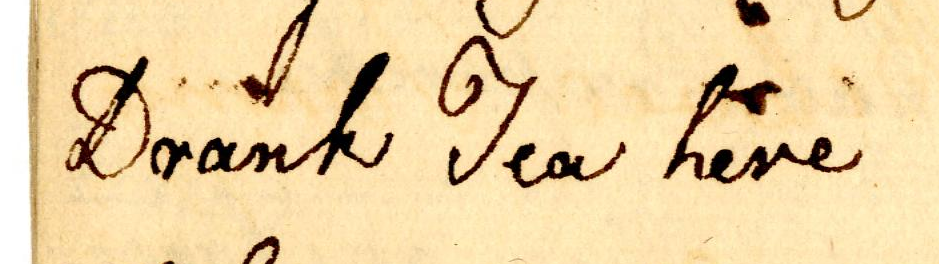Drank Tea here
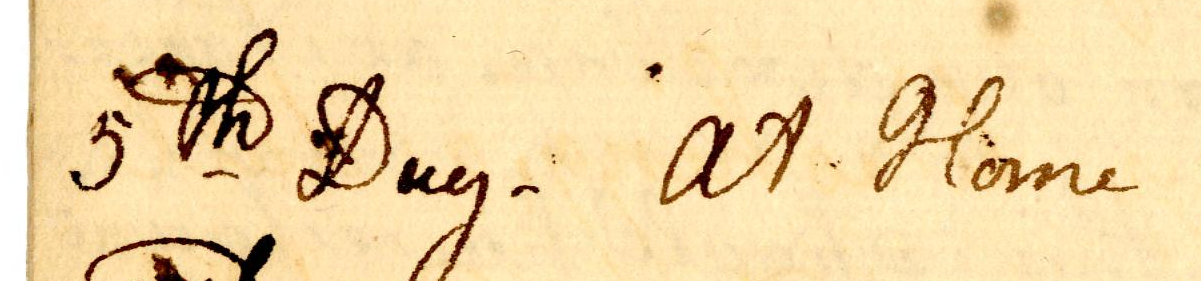5^th Day- At Home
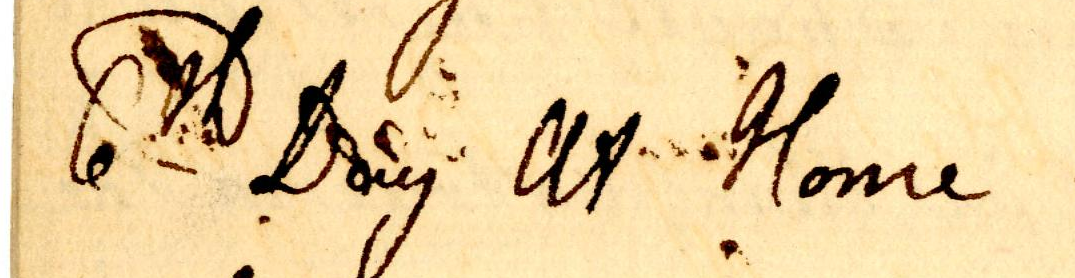6^th Day At Home
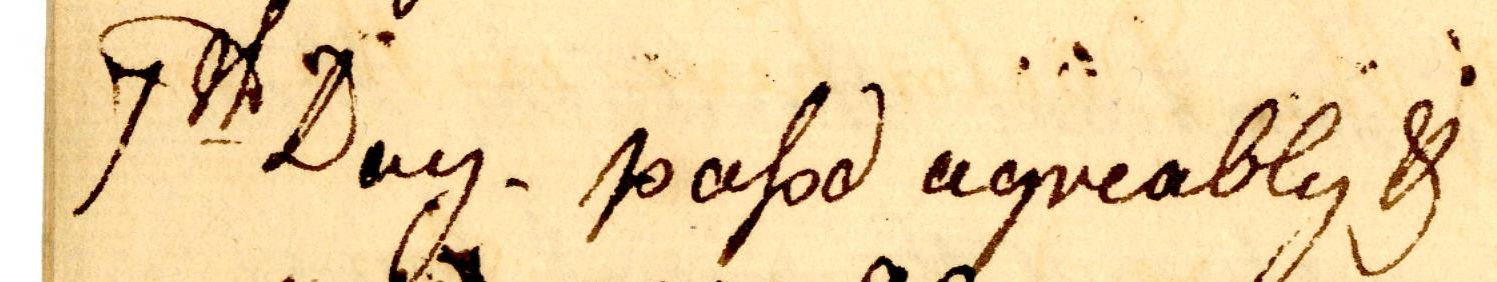7^th Day- passd agreably &
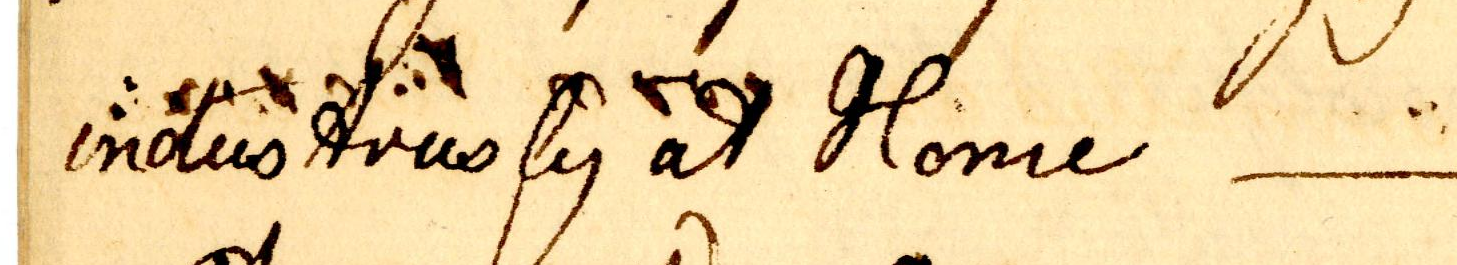industriusly at Home
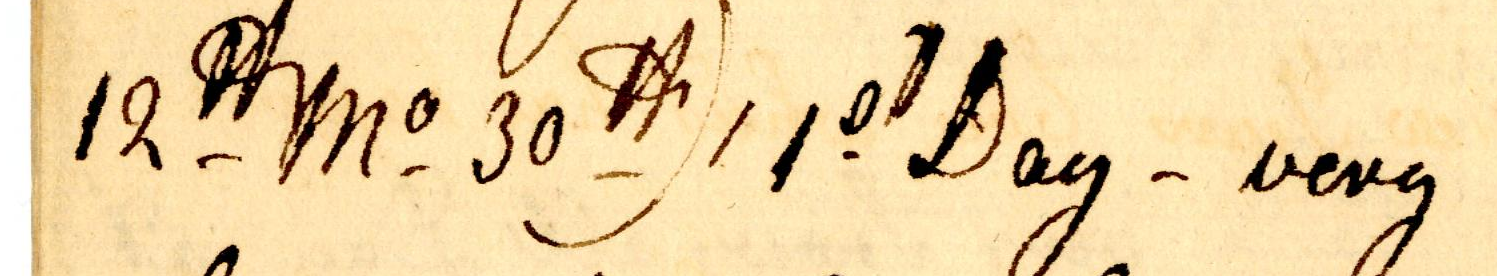12^th M^o 30^th) 1^st Day- very
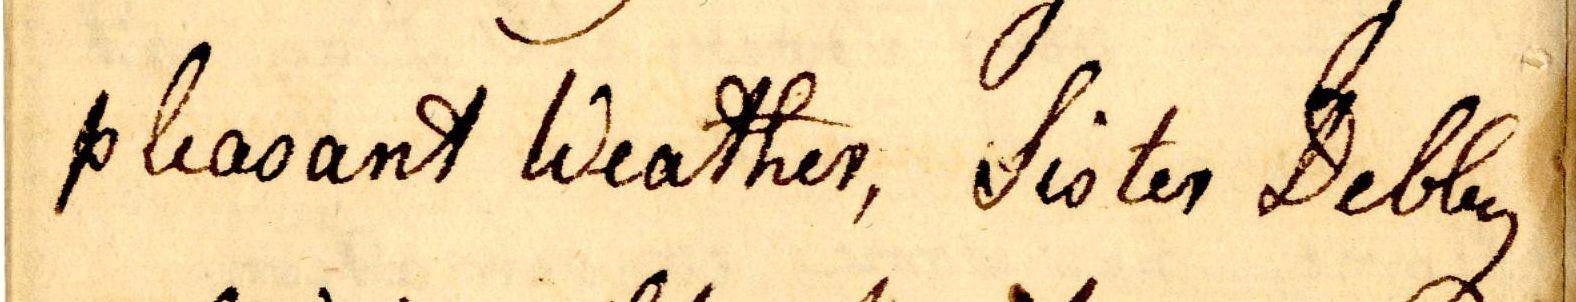pleasant Weather, Sister Debby
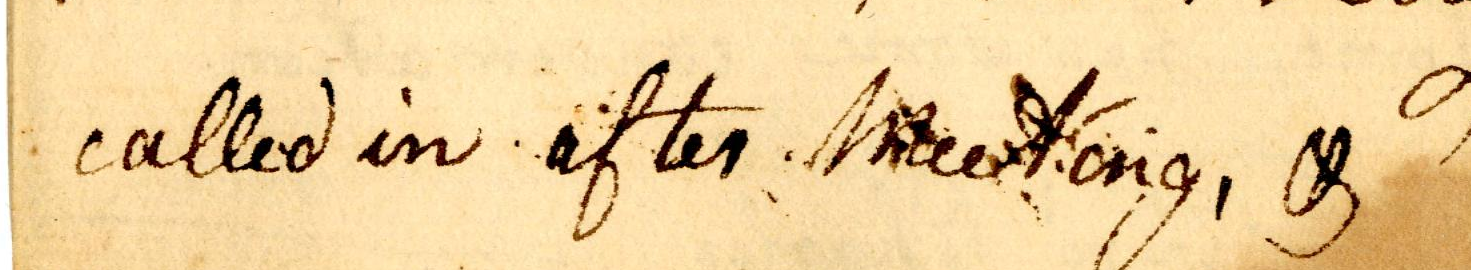called in after Meeting, &
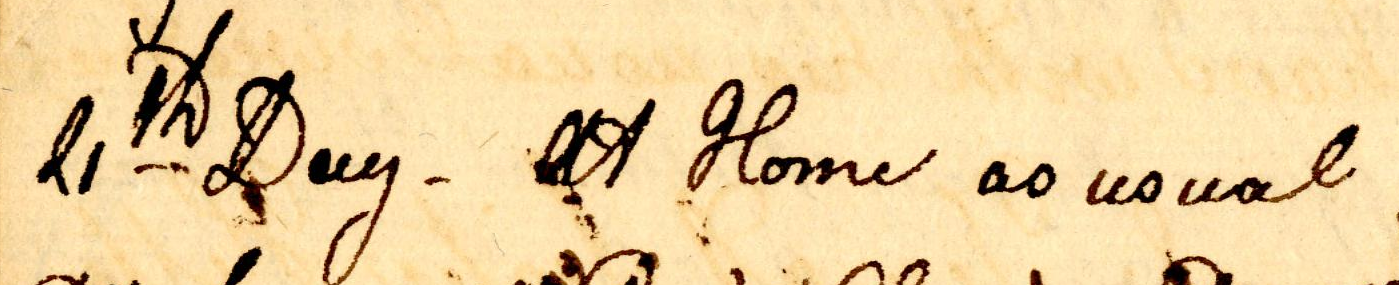4^th Day- At Home as usual
